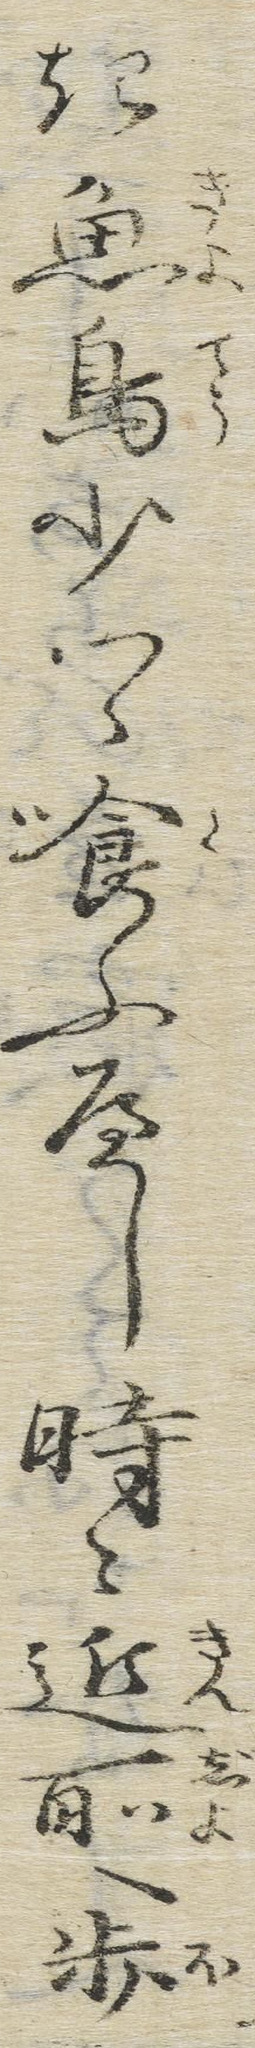き魚鳥少つゝ食ふへし時に近所へ歩
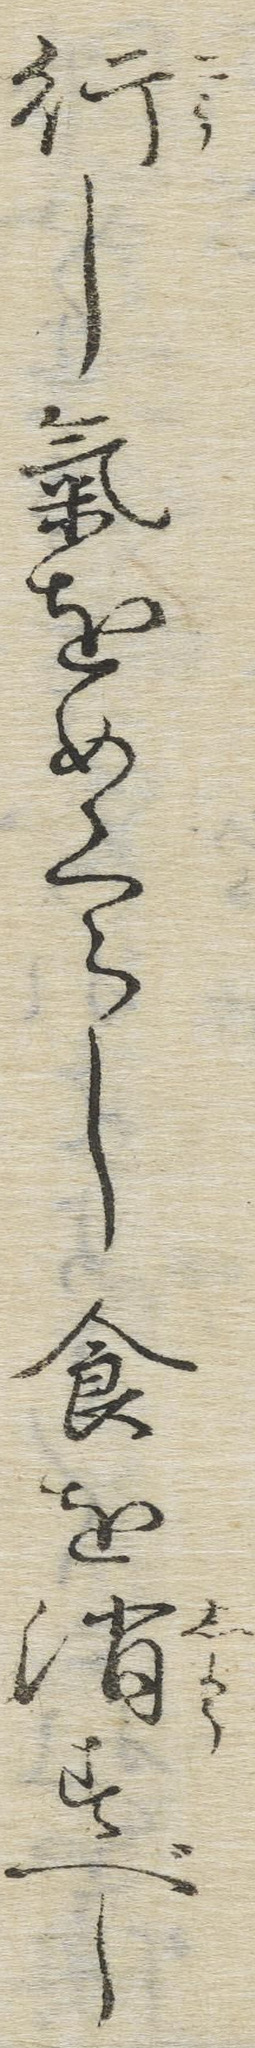行し気をめくらし食を消すへし
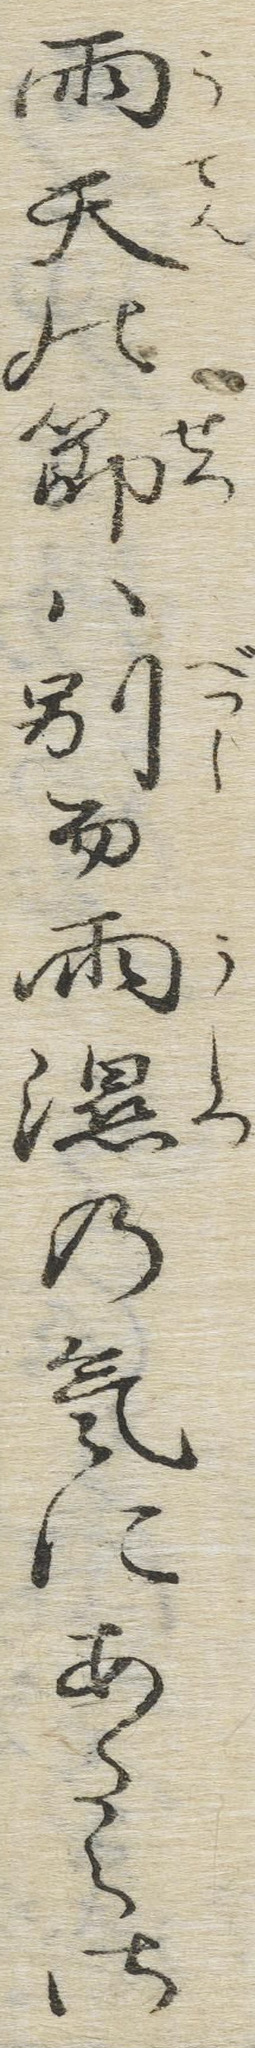雨天の節は別て雨湿の気にあたらさ
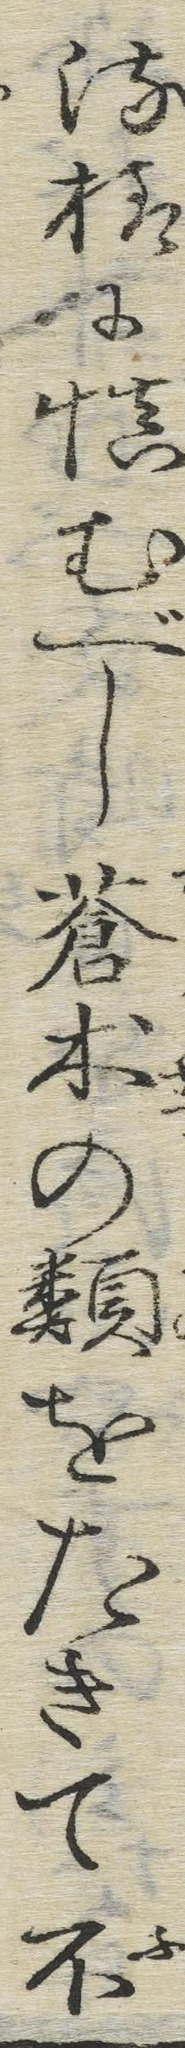る様に慎むべし蒼朮の類をたきて不
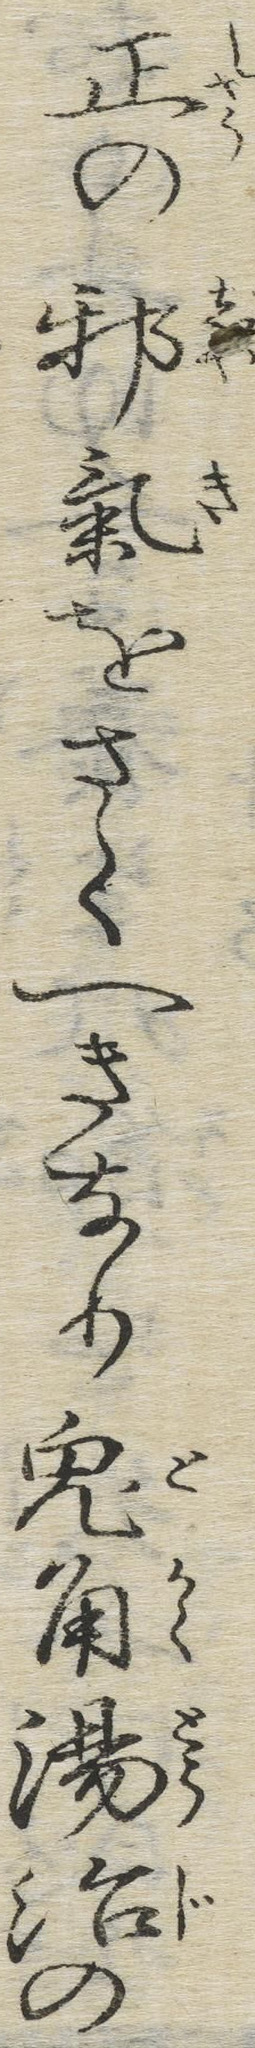正の邪気をさくへきなり兎角湯治の
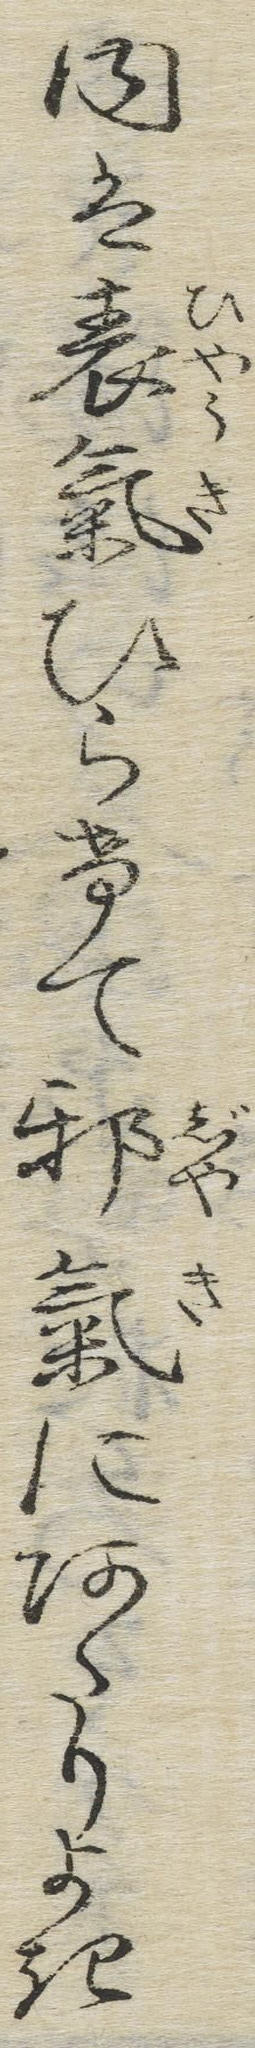内は表気ひらけて邪気にあたりよき
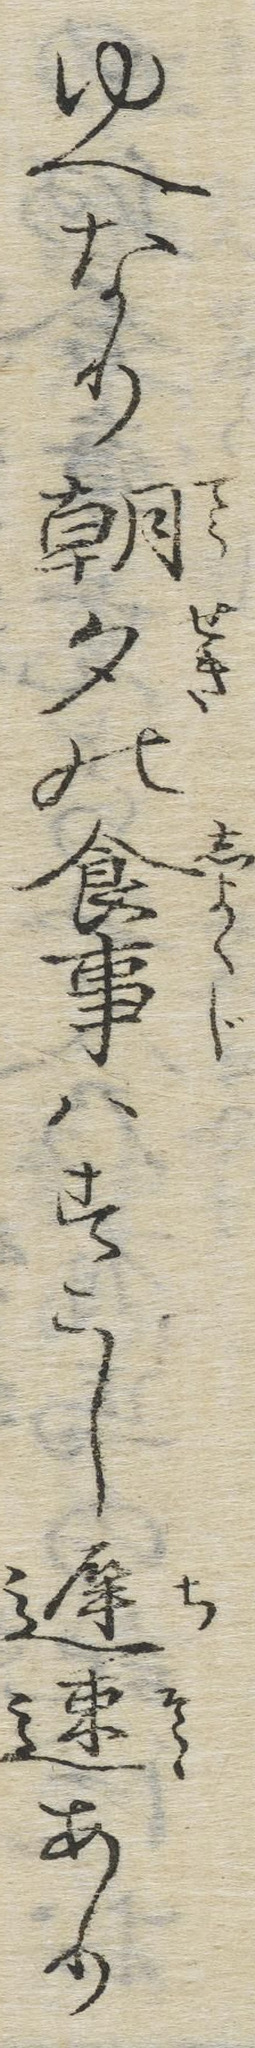ゆへなり朝夕の食事はすこし遅速あり
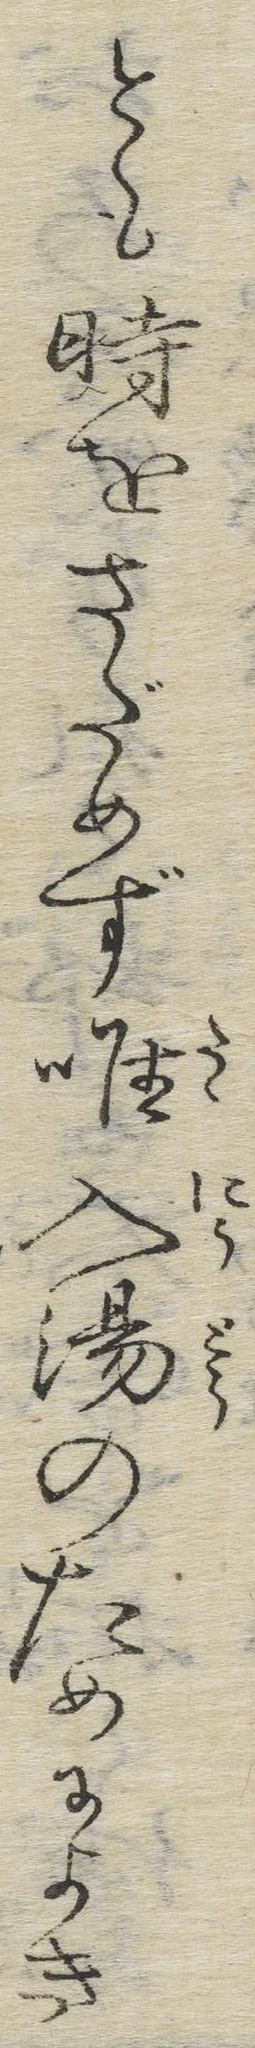とも時をさだめず唯入湯のためによき
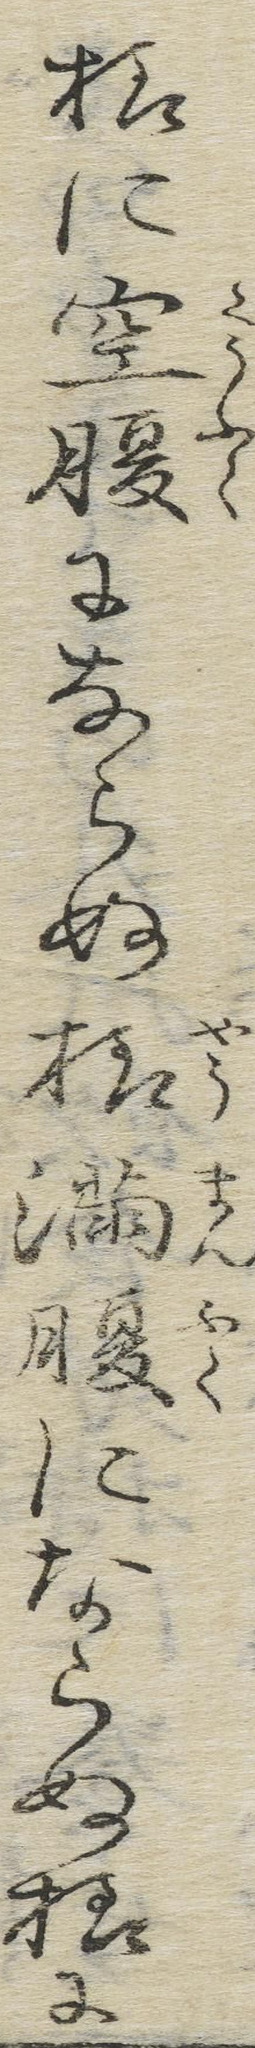様に空腹にならぬ様満腹にならぬ様に
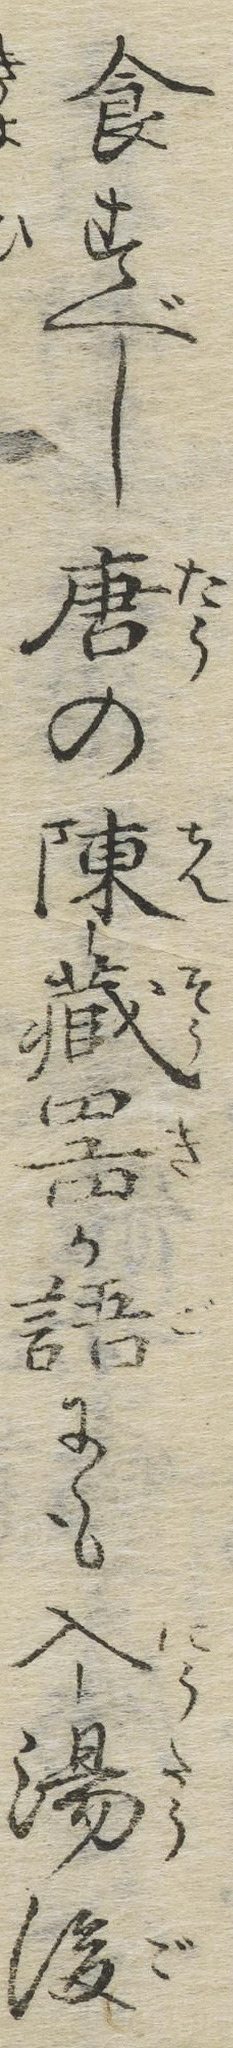食すべし唐の陳蔵器か語にも入湯後
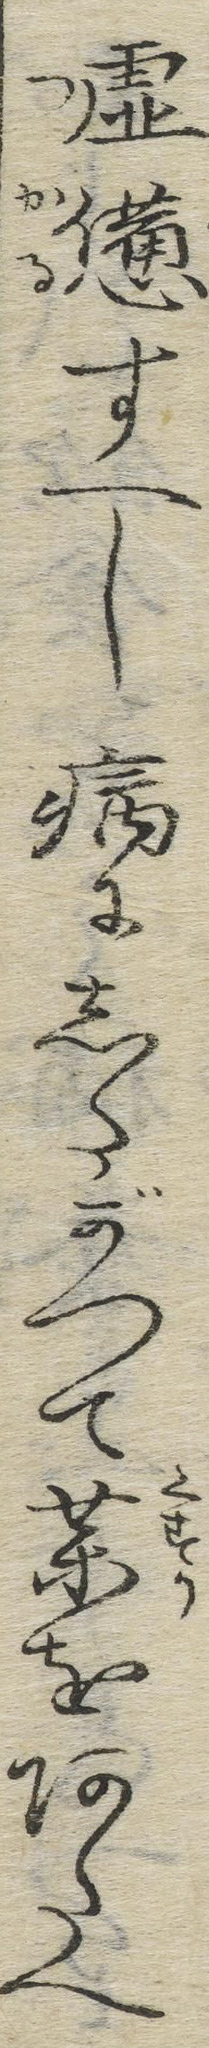虚憊すへし痛にしたがつて薬をあたへ

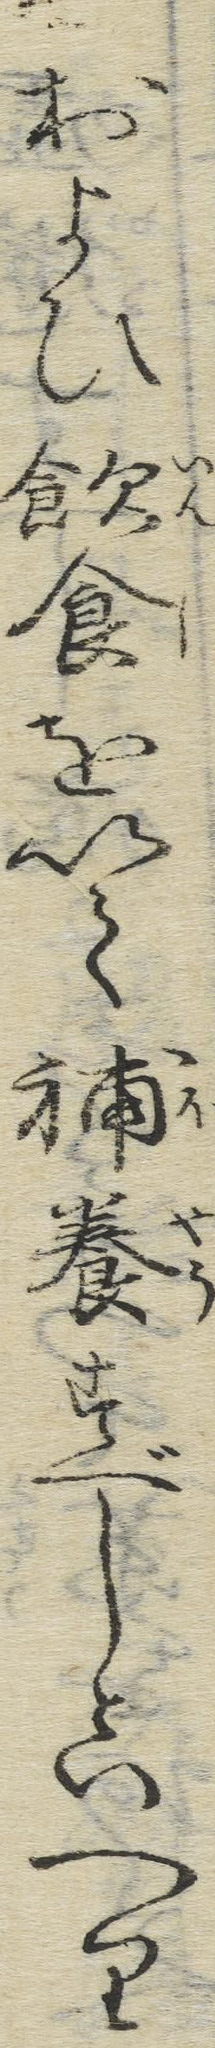およひ飲食を以て補養すべしといへり
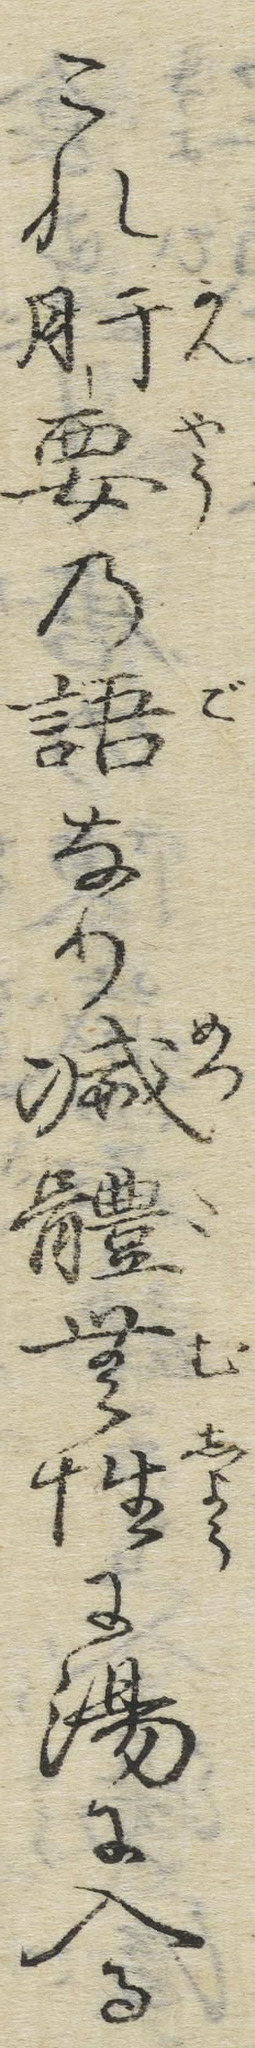これ肝要の語なり滅体無性に湯に入る
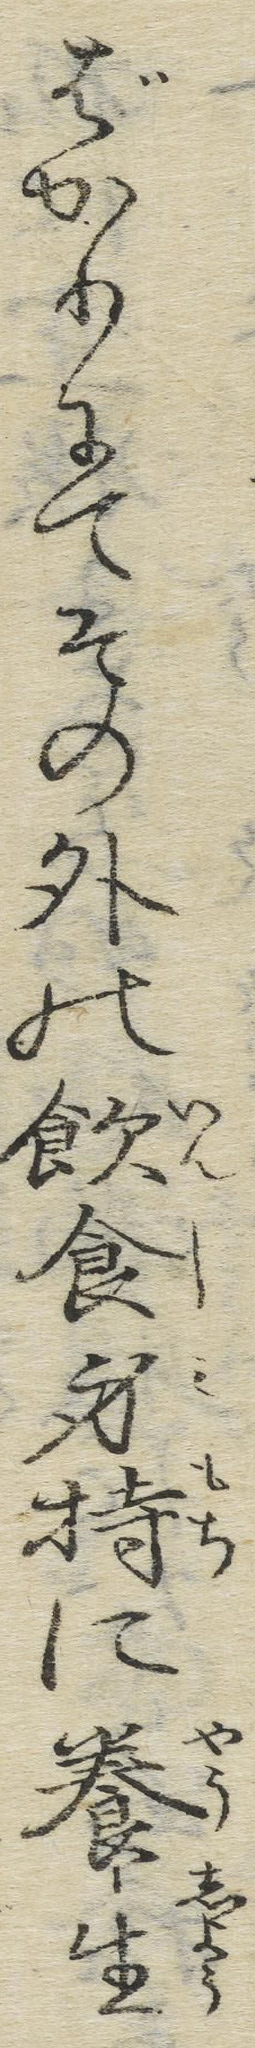ばかりにてその外の飲食身持に養生
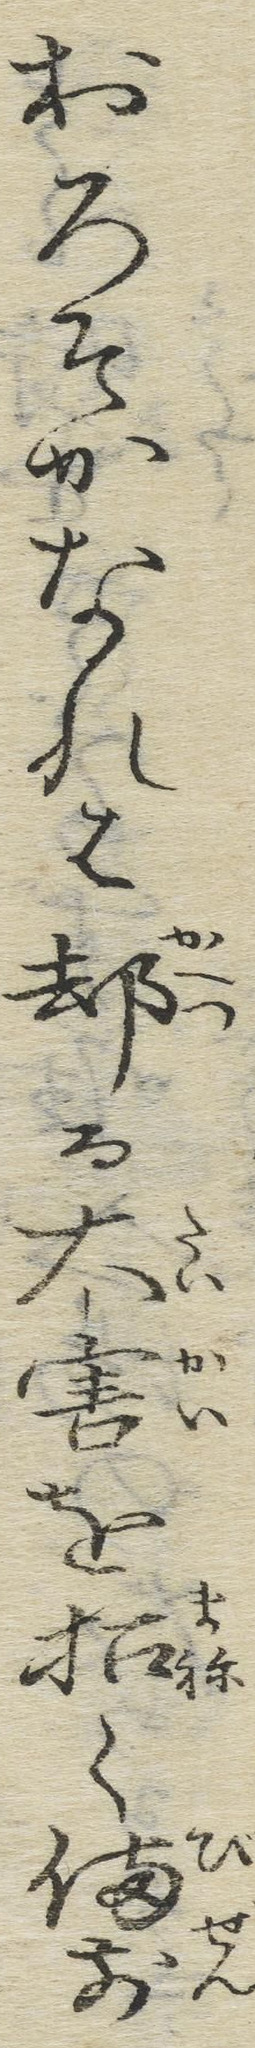おろそかなれは却て大害を招く備前
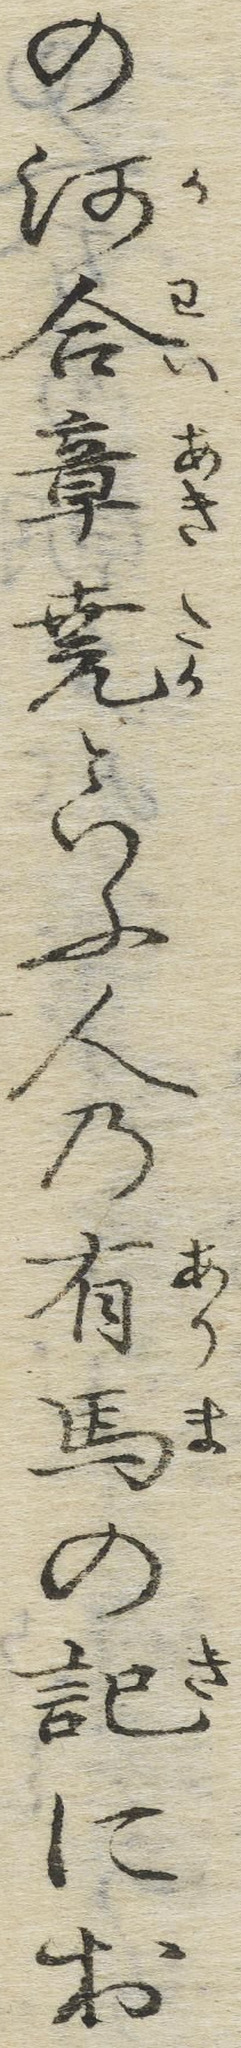の河合章尭といふ人の有馬の記にお
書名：温泉考
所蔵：東京大学地震研究所図書室 Earthquake Research Institute Library, The University of Tokyo, JAPAN
